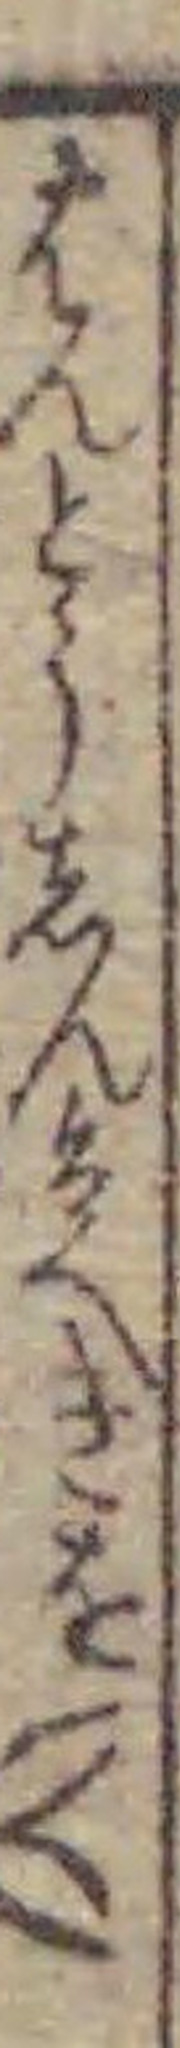はんとうしん兵へきを
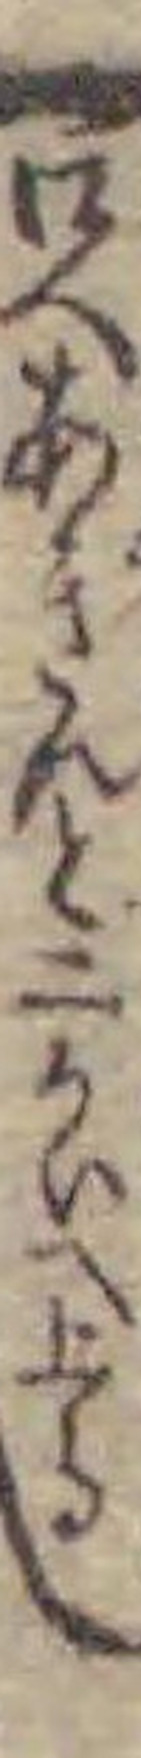口へあきんと二かいへ上る
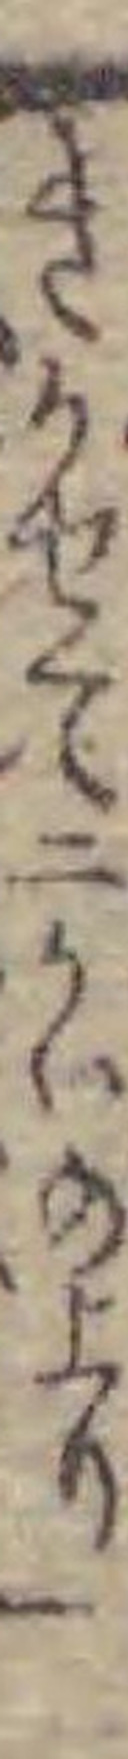きかせて二かいの上り
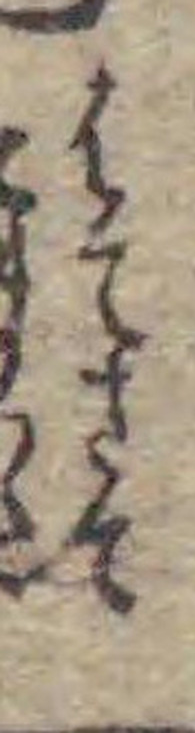はてさて
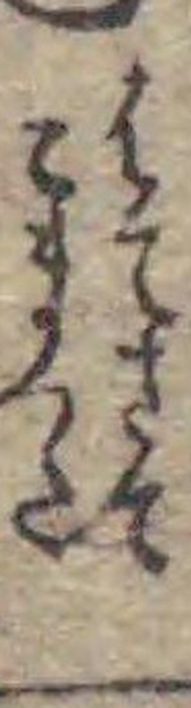こまつた
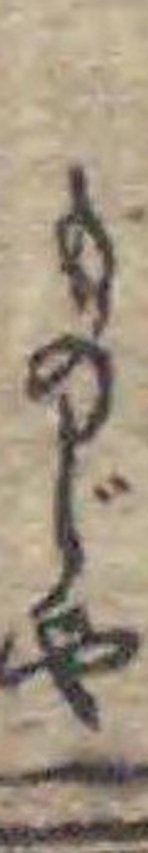ものじや
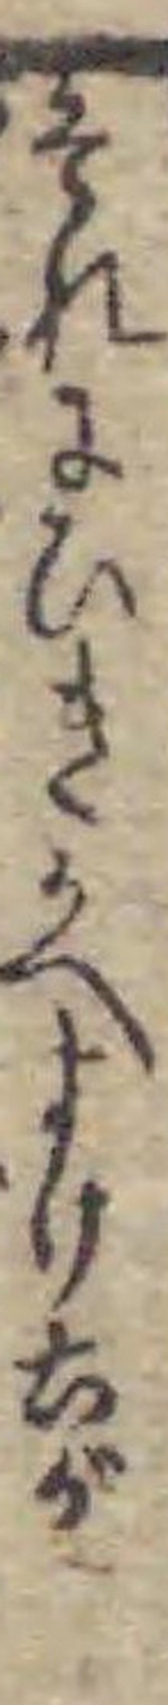それにひきかへすけ六が
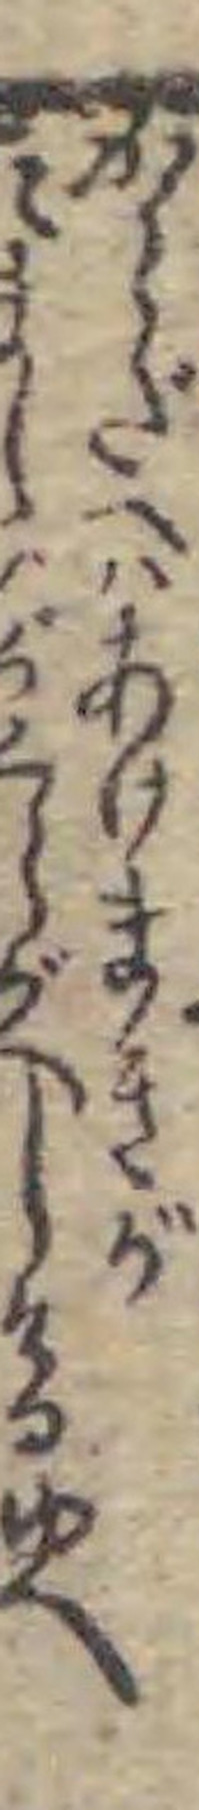たましいがくらがへしけるゆへ
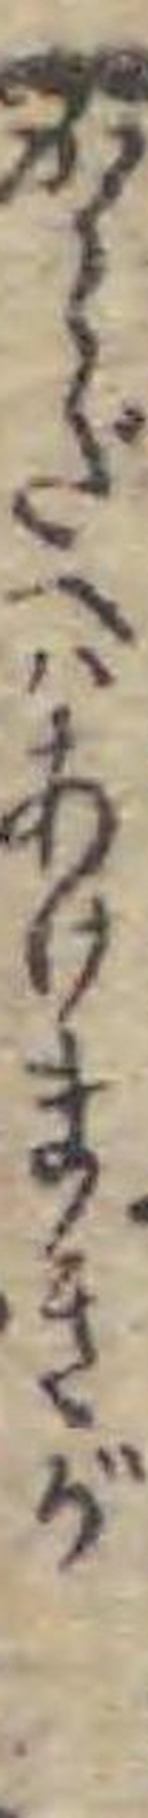からだへはあけまきが
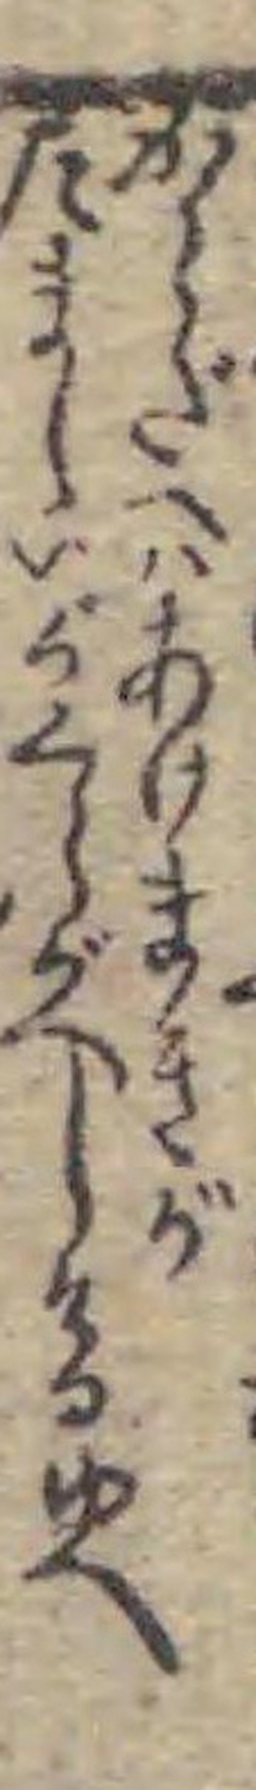たましいがくらがへしけるゆへ
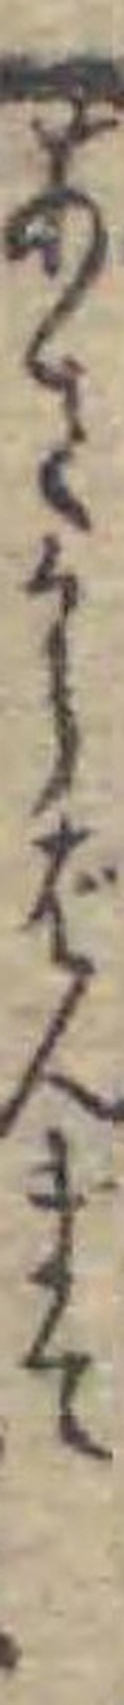あさからばんまで
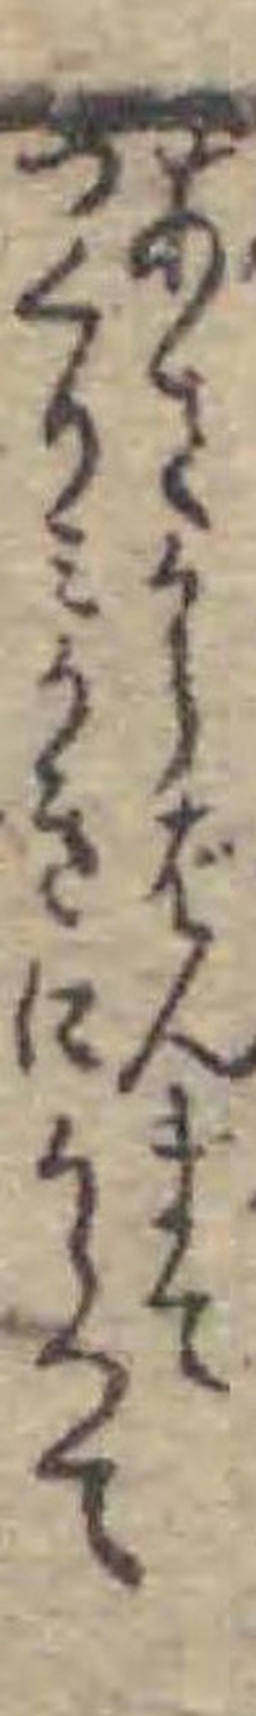つくりみかきにかゝつて
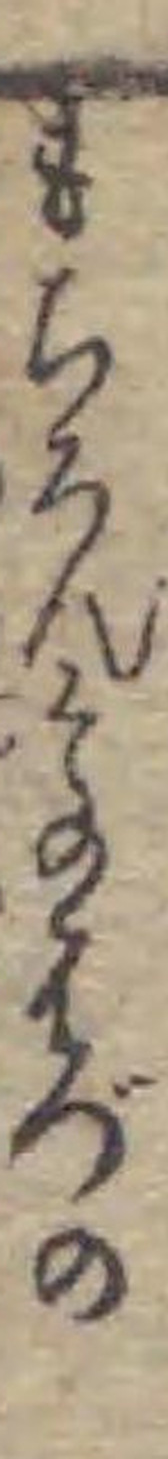もちろんそのはづの
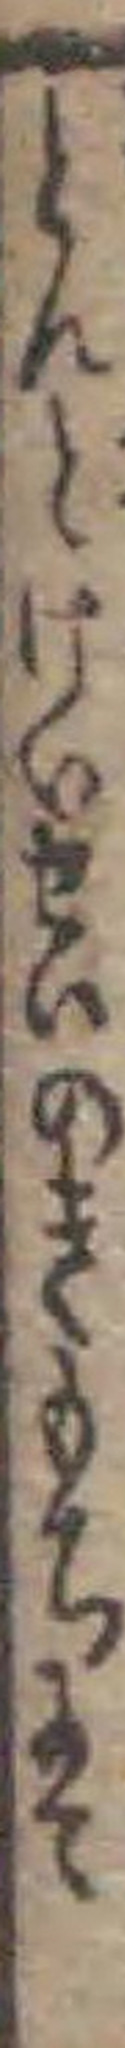とんとけいせいのきもちにて
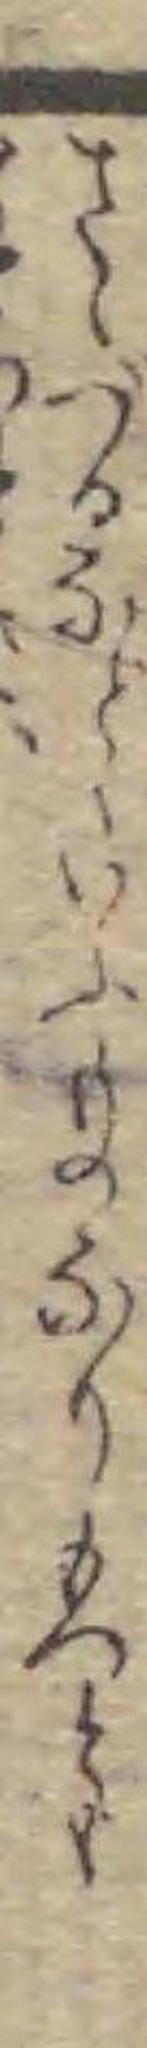さゝづるなどゝいふものなりもつとも
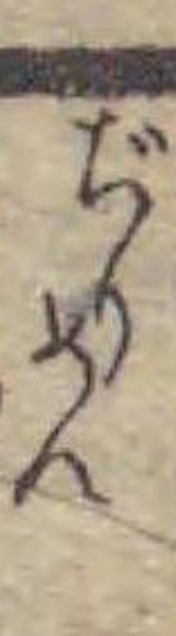ぢりめん
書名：江戸花俳優贔屓 : 3巻
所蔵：国立国会図書館 National Diet Library, JAPAN
